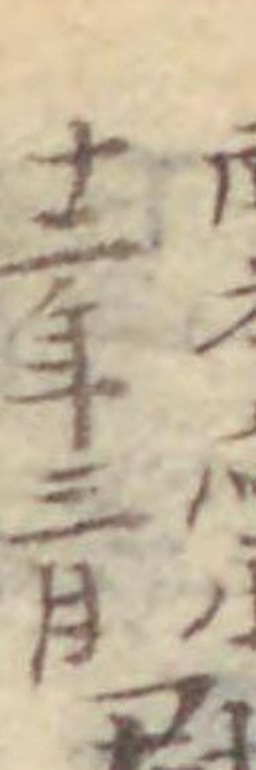十二年三月
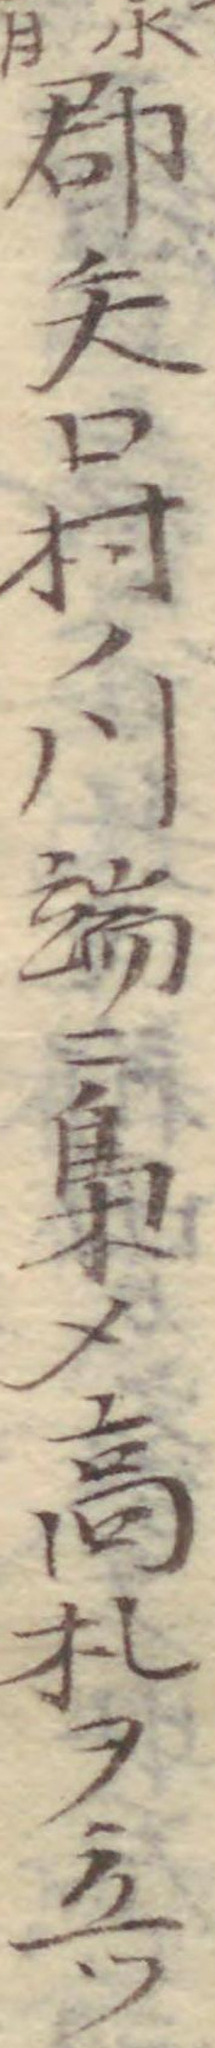郡矢口村ノ川端ニ梟シテ高札を立ツ
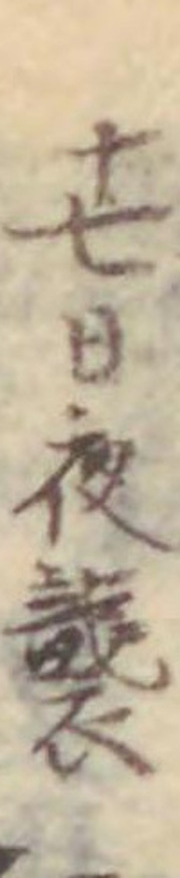十七日夜襲
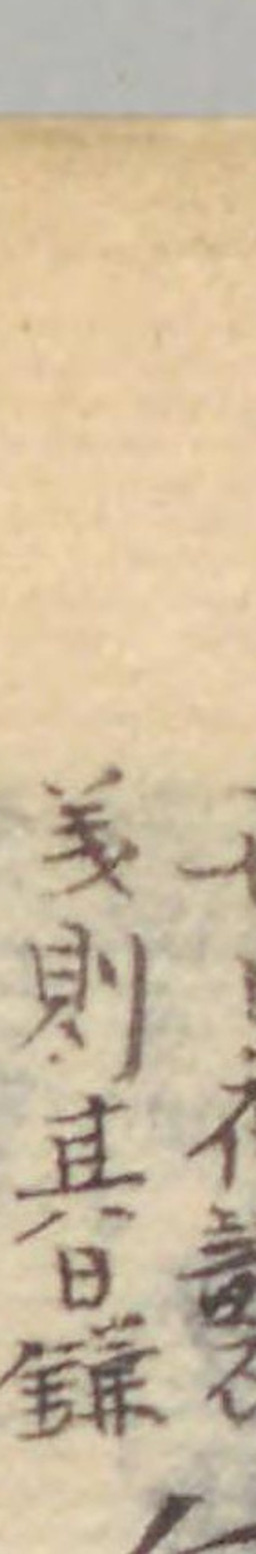義則其日鎌
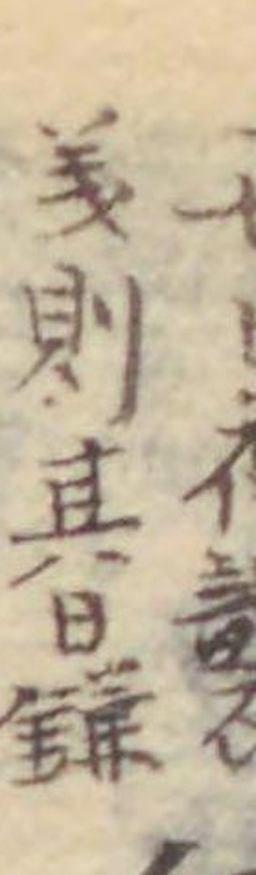義則其日鎌
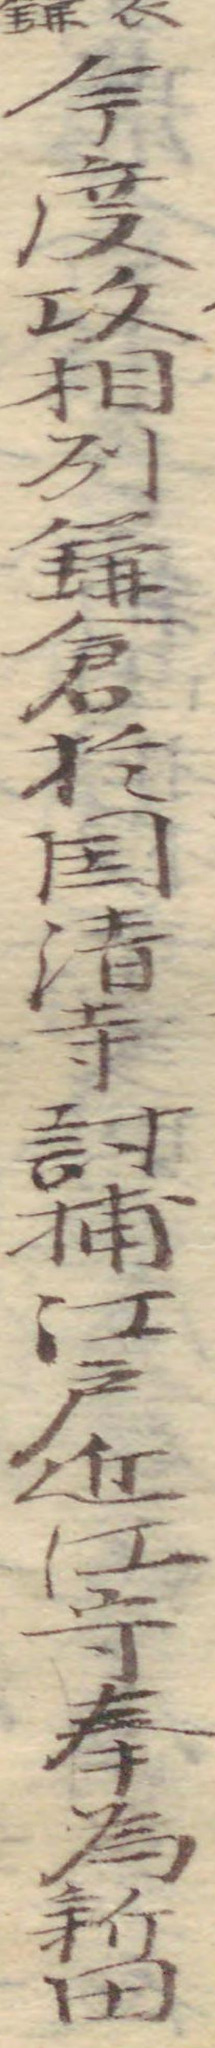今度攻相州鎌倉於国清寺討捕江戸近江守奉為新田
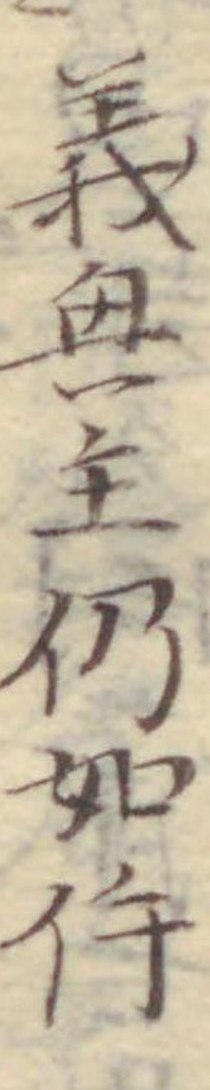義興主仍如行
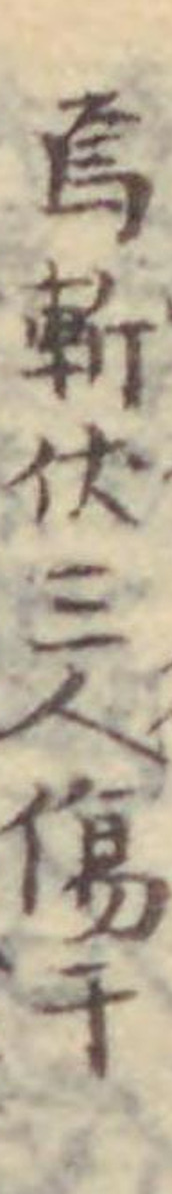為斬伏三人傷于
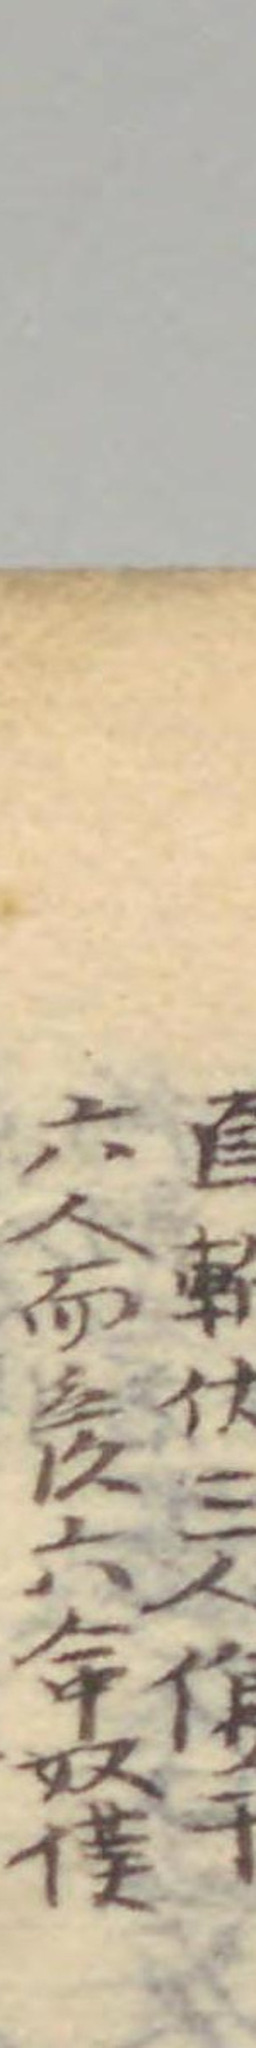六人而彦六命奴僕
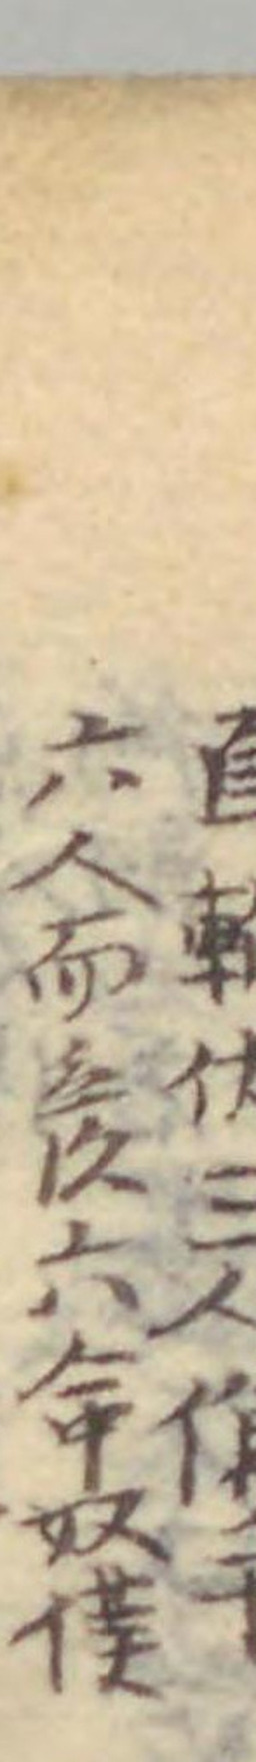六人而彦六命奴僕
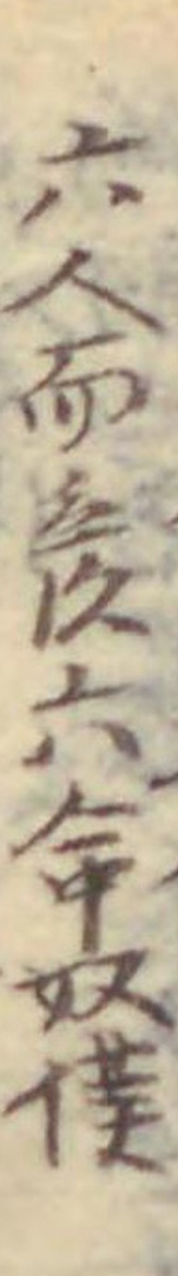六人而彦六命奴僕
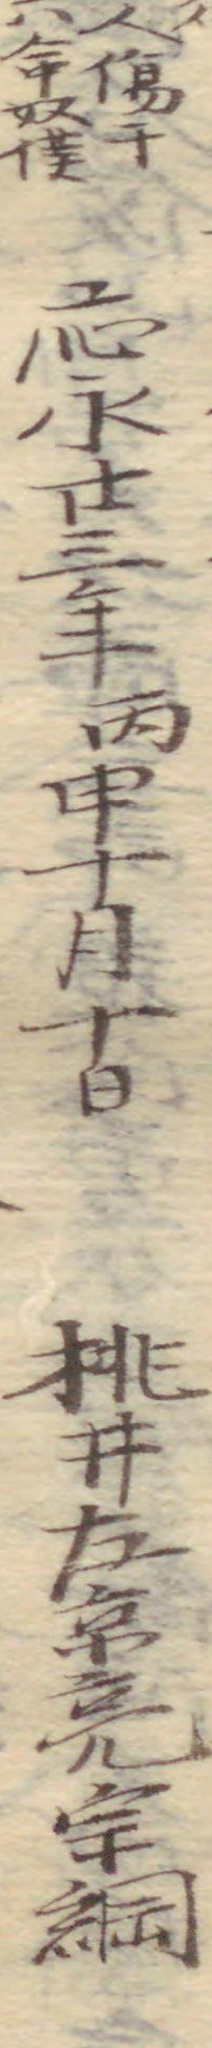応永廿三年丙申十月十日桃井左京亮宗綱
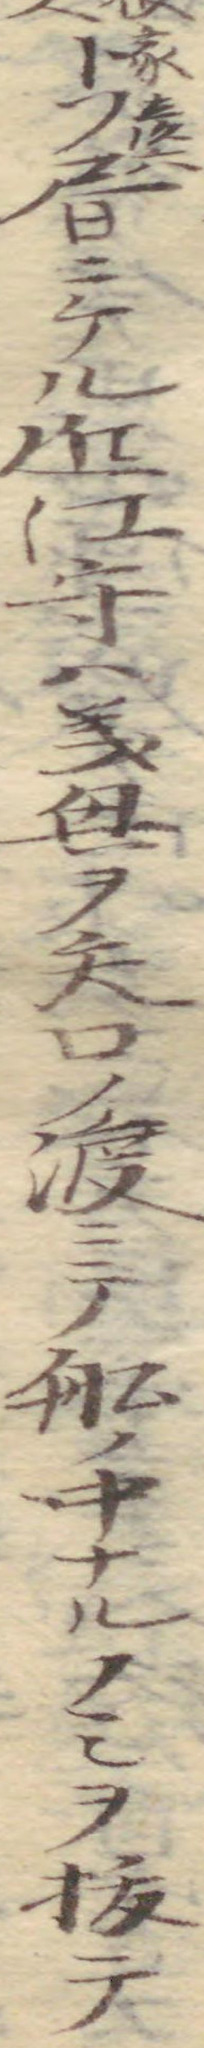トソ書ニケル近江守ハ義興ヲ矢口ノ渡ニテ船ノ中ナルノミヲ抜テ
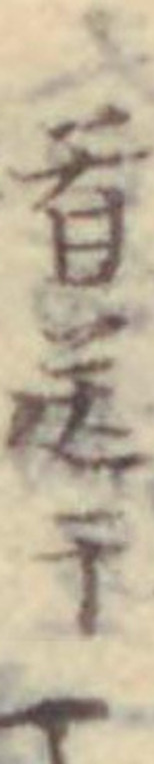看送于
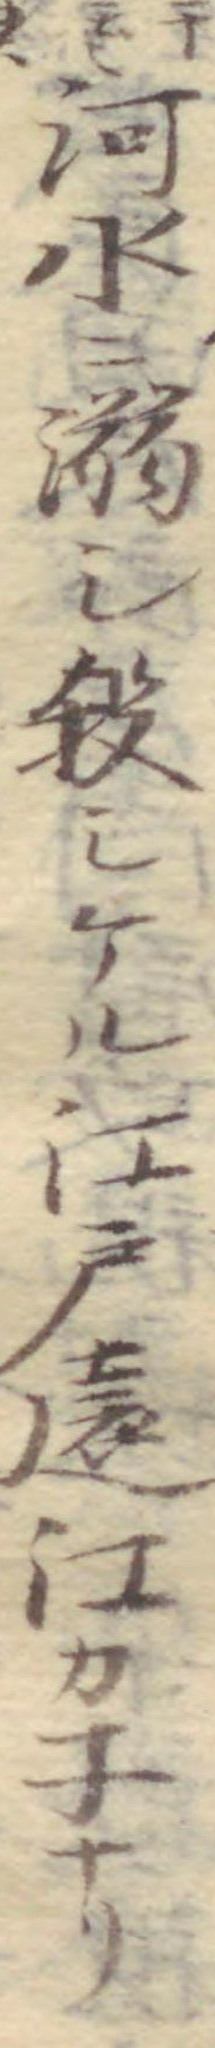河水ニ溺シ殺シケル江戸遠江カ子ナリ
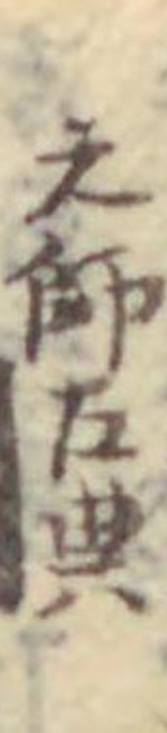元帥左典
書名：鶯宿雑記. 巻199-200
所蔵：国立国会図書館 National Diet Library, JAPAN
